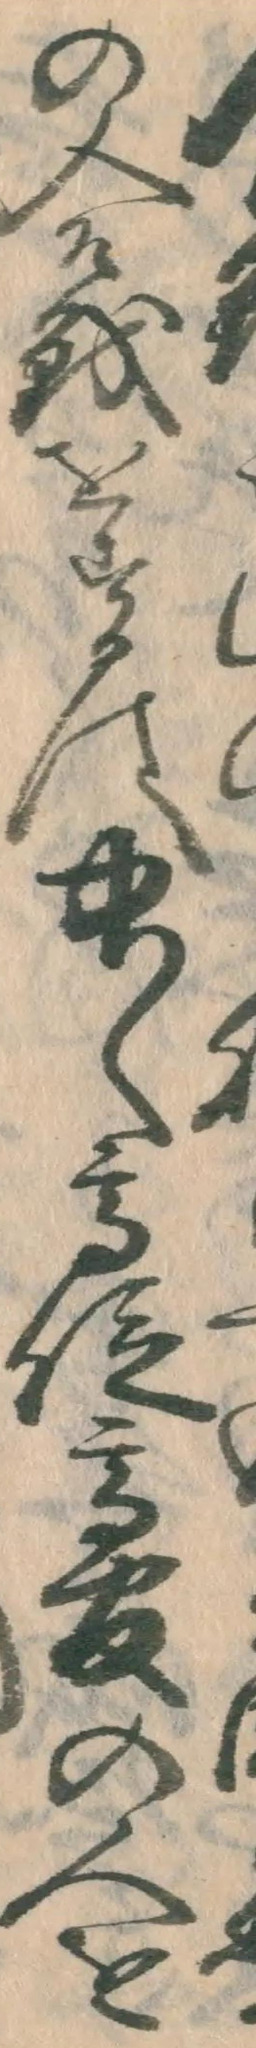の合戦をするは中々高位高官の人を
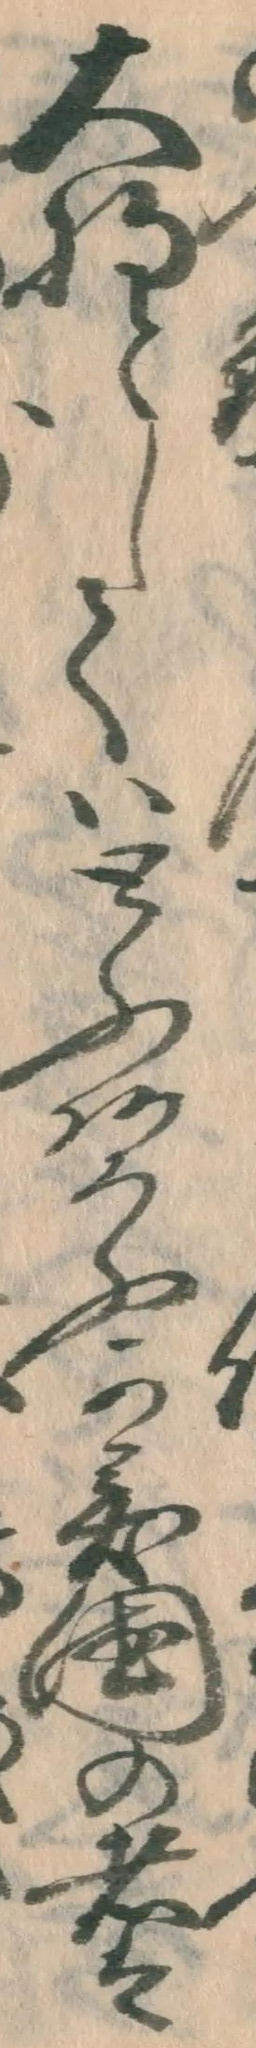大将としてハとふあろふか異国の者は
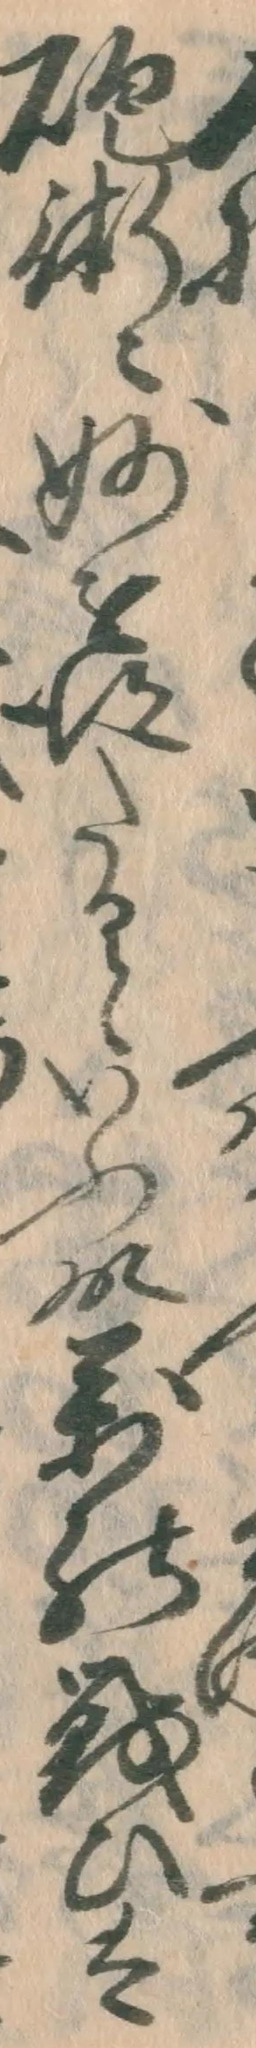砲術ニ妙を得たるといふ処萬の戦ひは
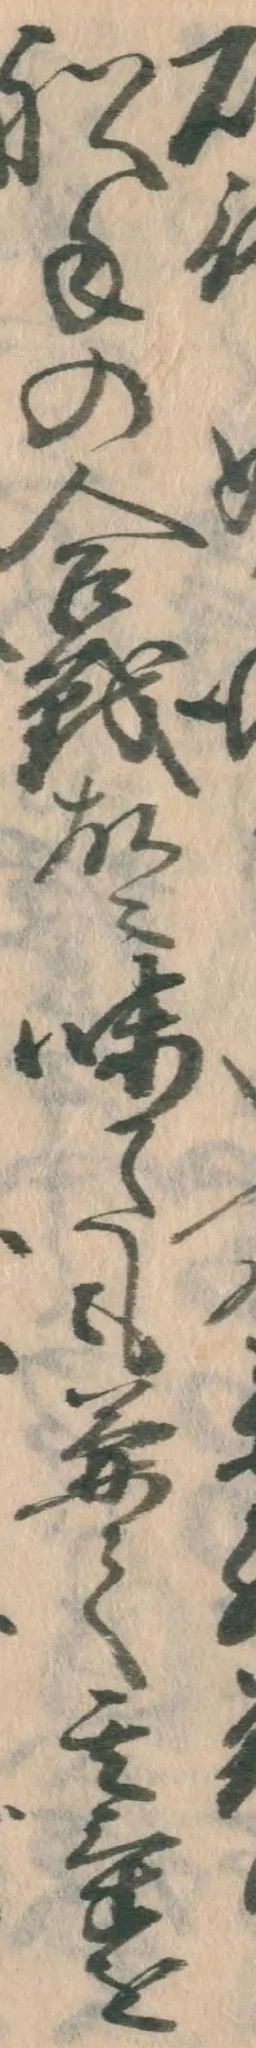船手の合戦故ニ味かたも兼て其氣を
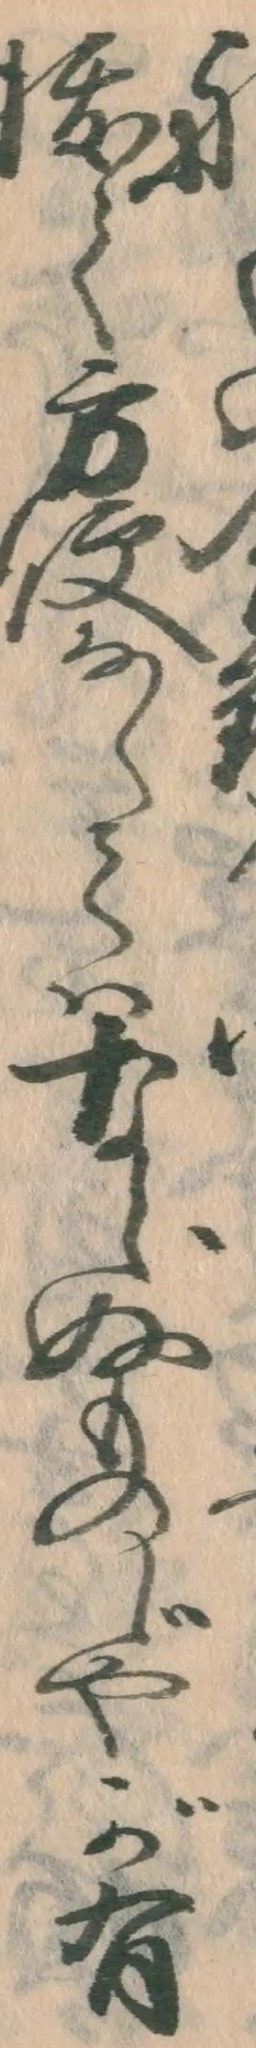抜く方便なくてハならぬものじやが有
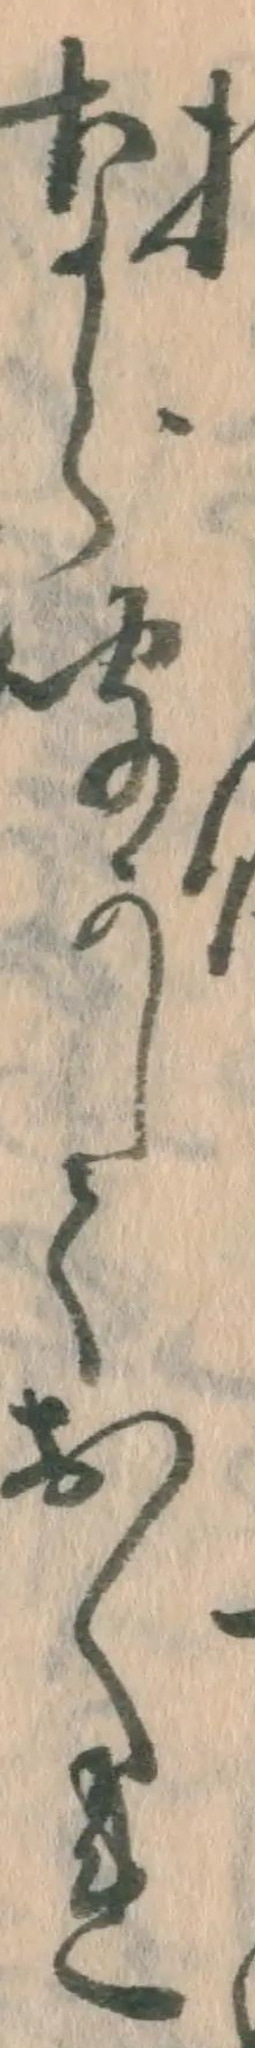なら聞かしておくれ
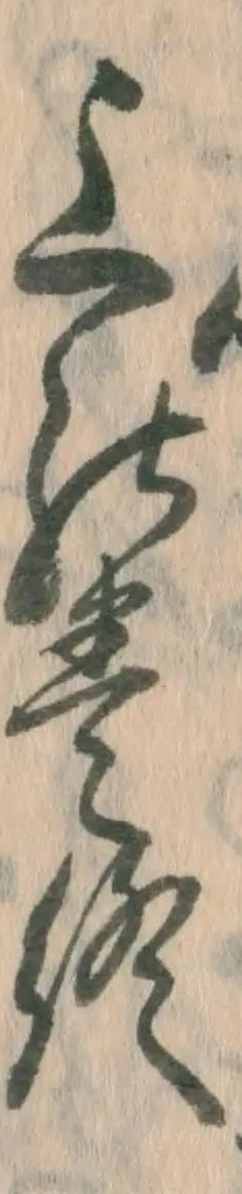上の巻終
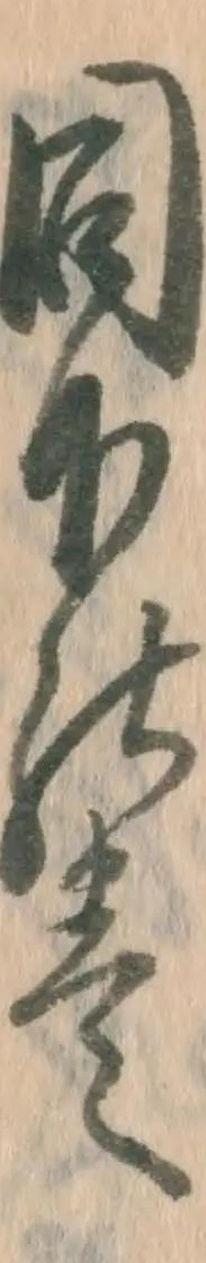同下の巻
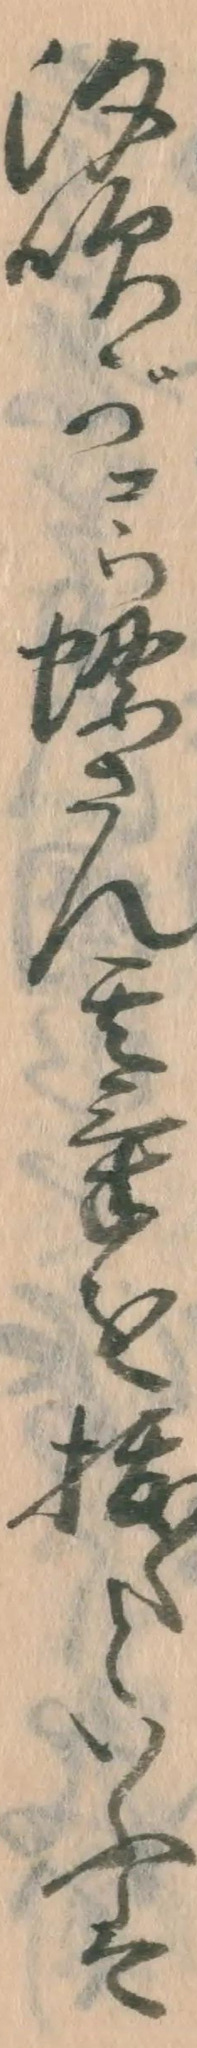汐吹がコウ螺さん其氣を抜くといふは
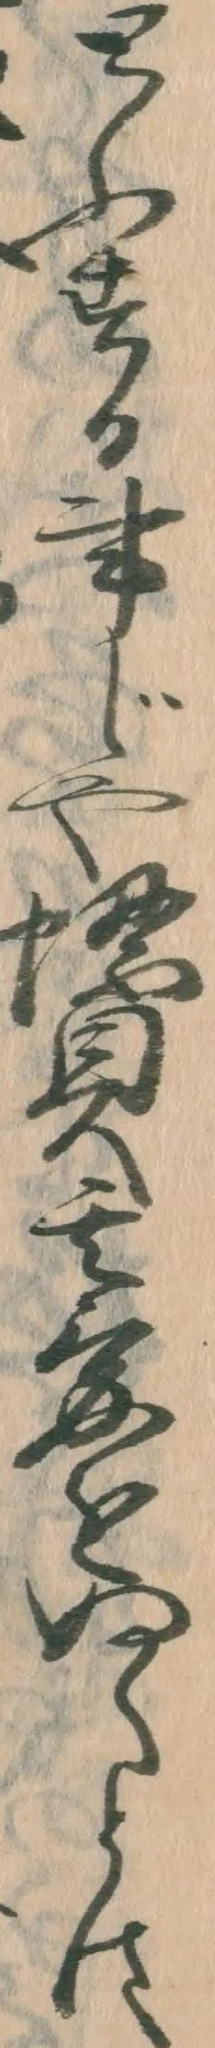とふする事じや螺貝其氣をぬくとは
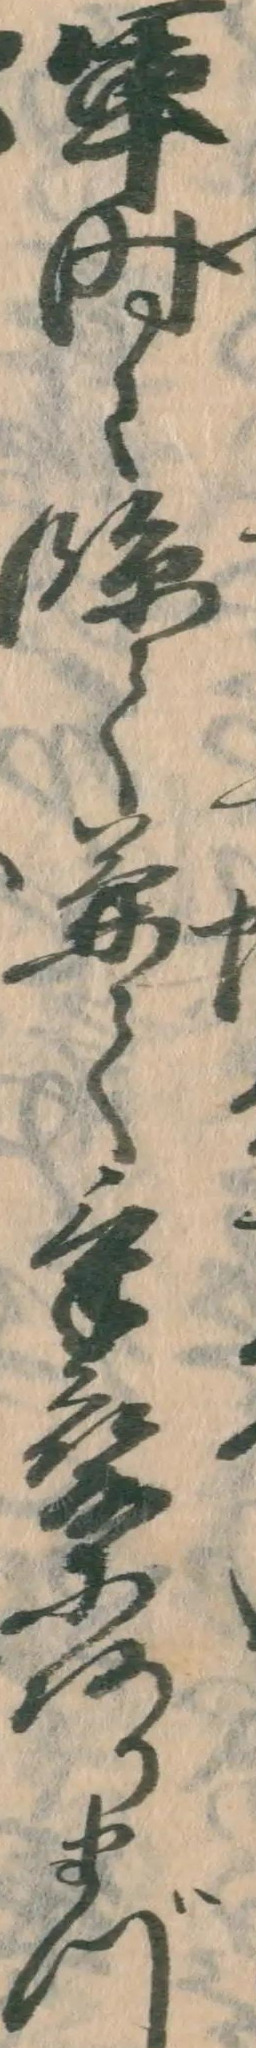軍事に臨て兼て氣変にありまづ
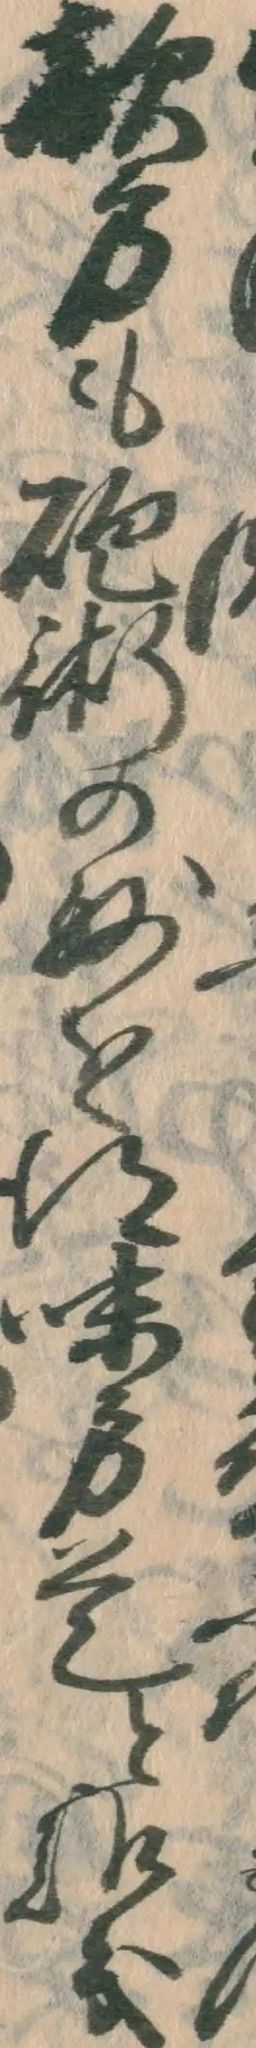敵方も砲術の妙を得味方是と難義
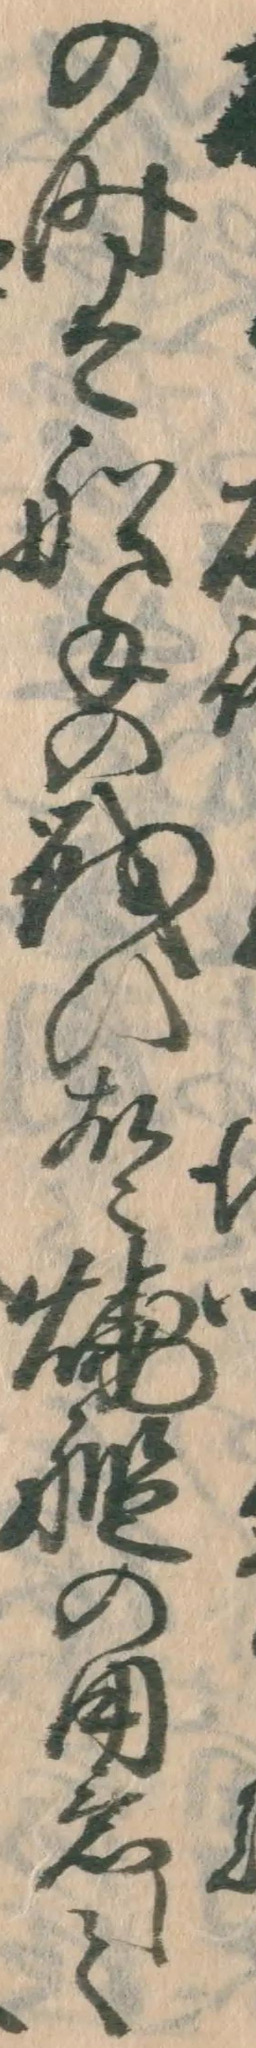の時は船手の戦ひ故ニ燒艦の用意して
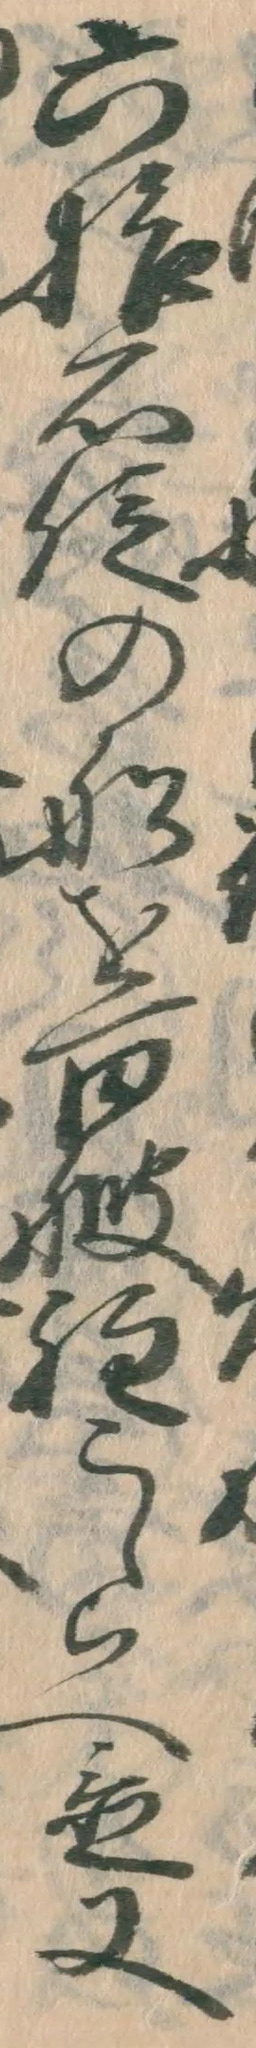六拾石位の船を百艘程こしらへ置又
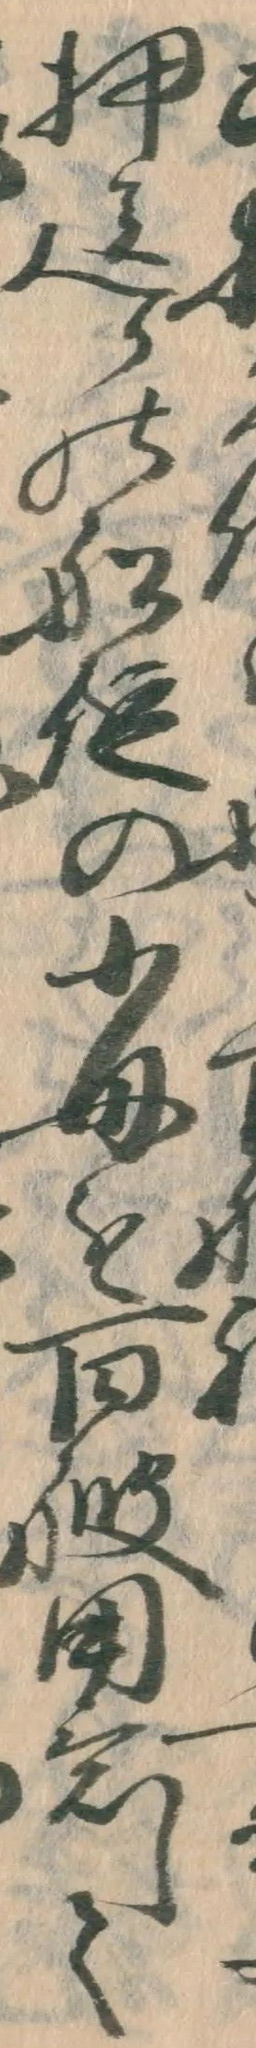押送りの船位の小舟を百艘用意して
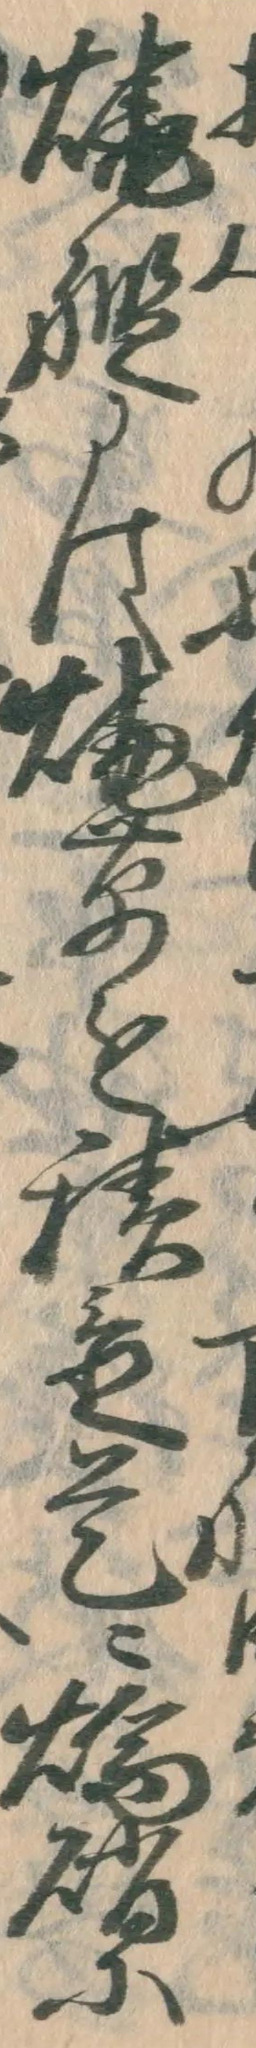燒艦には燒草を積置是ニ熖硝に
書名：麗斎叢書. 20
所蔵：国立国会図書館 National Diet Library, JAPAN
